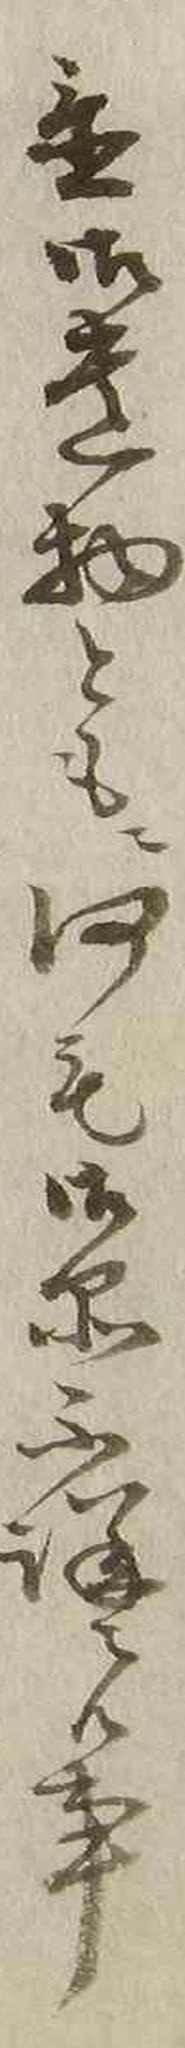置御遺物ともニ何も御品不詳ニ候事
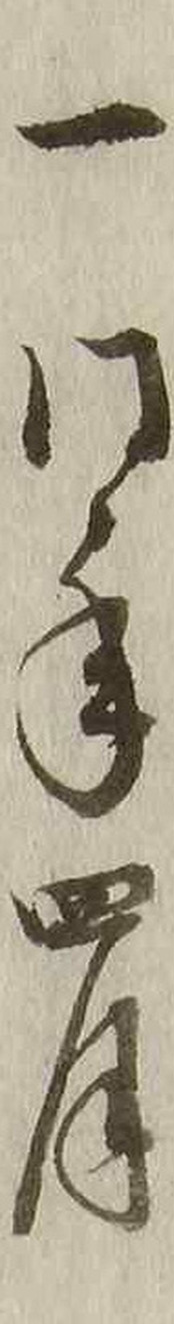一同年四月
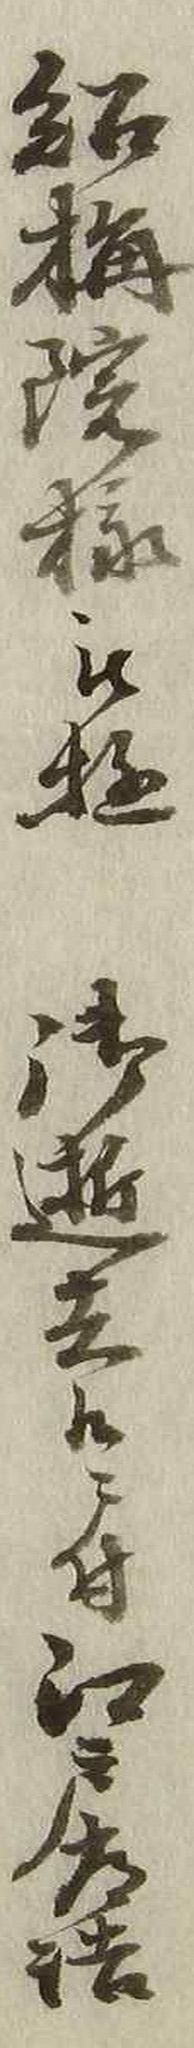紹栴院様被遊御逝去候ニ付江戸常詰
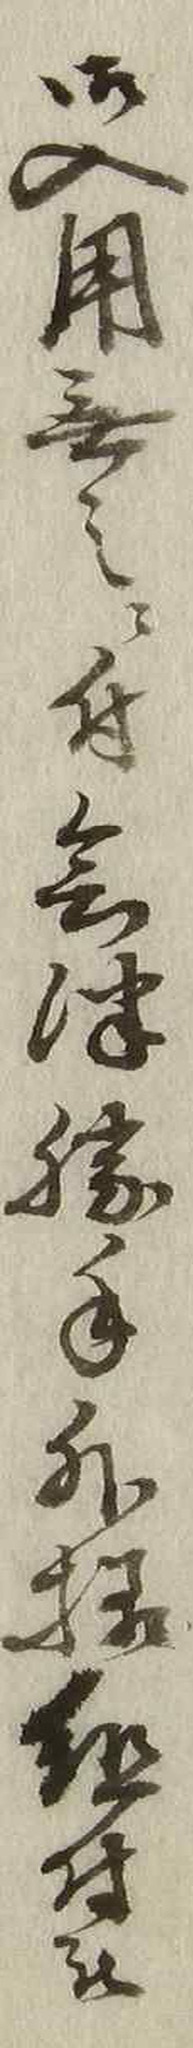御入用無之ニ付会津勝手外様組付被
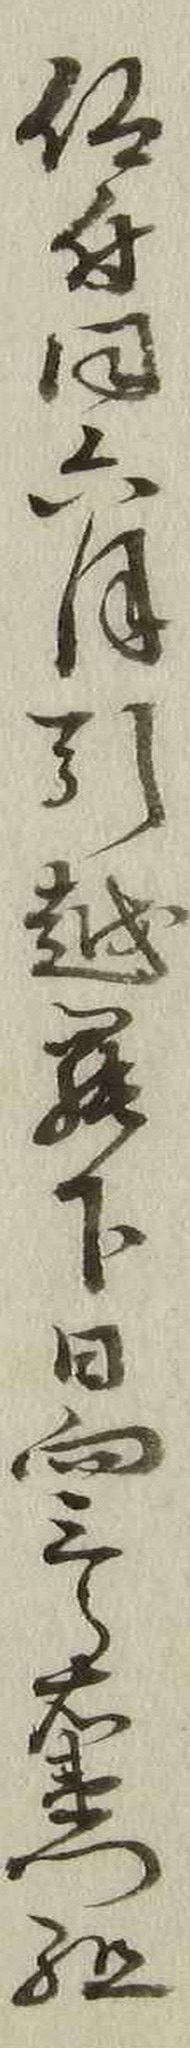仰付同六月引越罷下日向三郎右衛門組
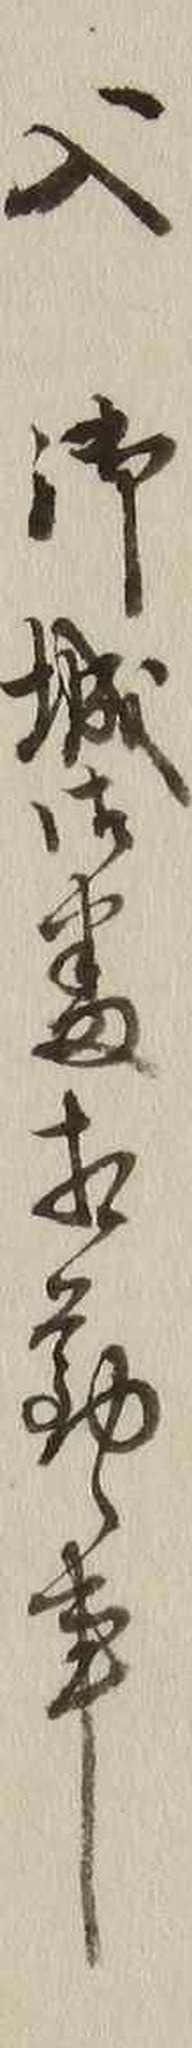へ入御城御番相勤候事
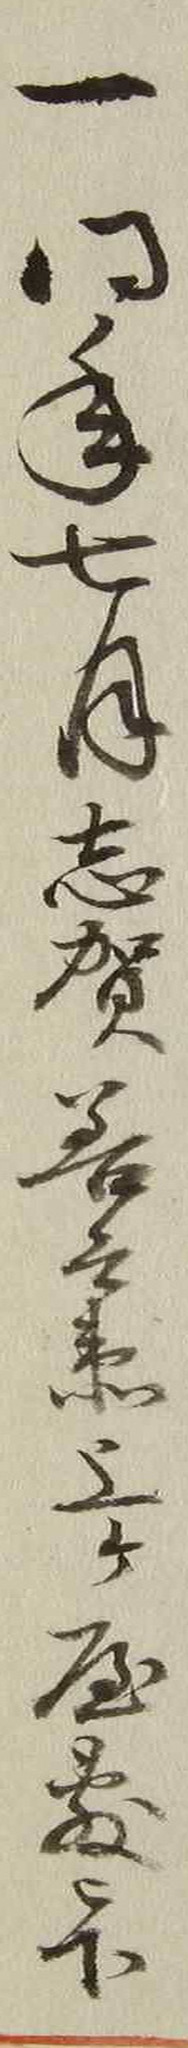一同年七月志賀善兵衛上ケ屋敷被下
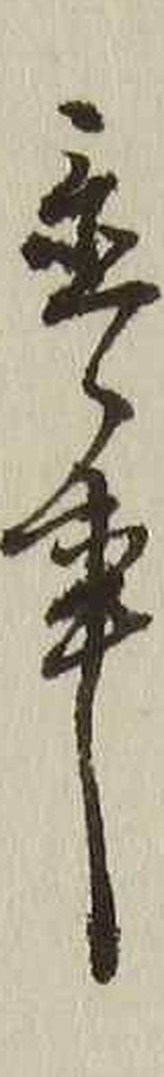置候事
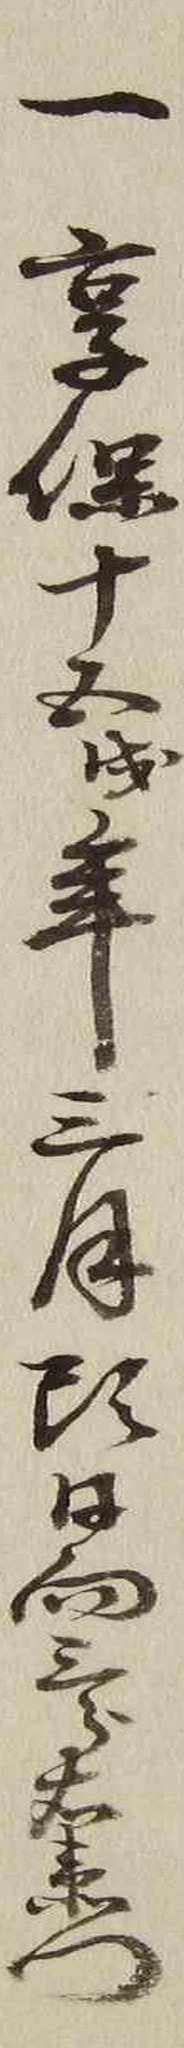一享保十五戌年三月頭日向三郎右衛門
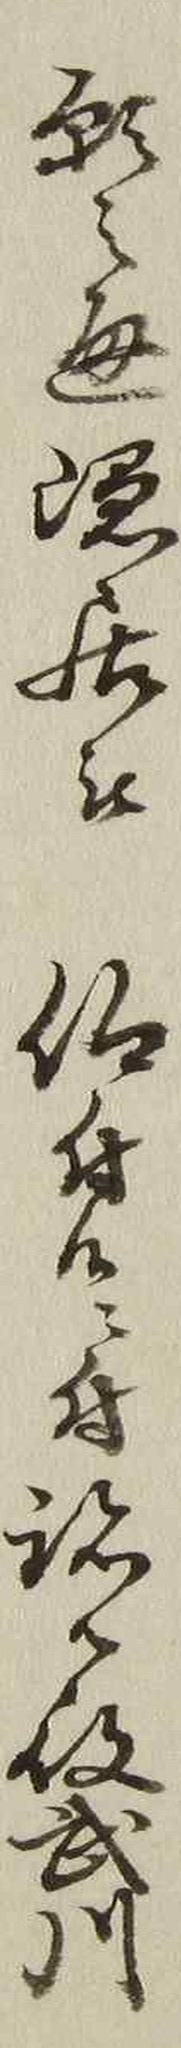願之通隠居被仰付候ニ付跡御役武川
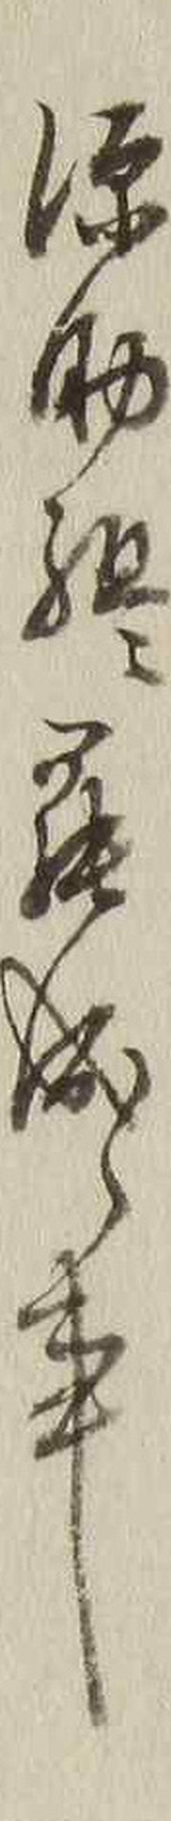源助組ニ罷成候事
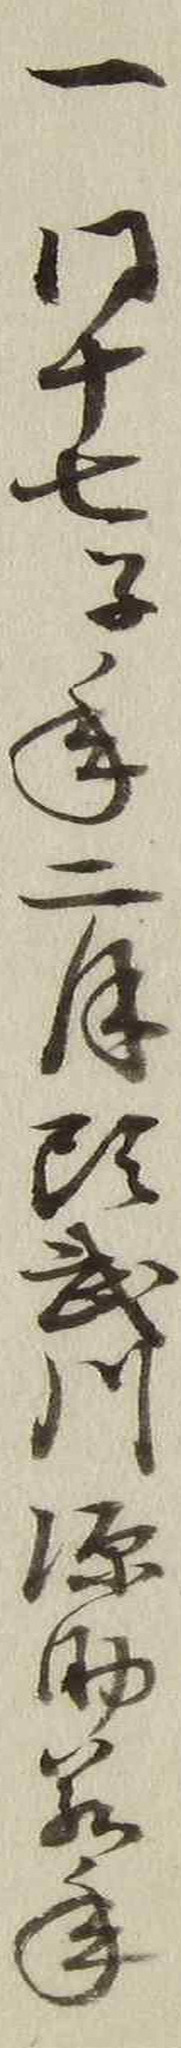一同十七子年二月頭武川源助若年
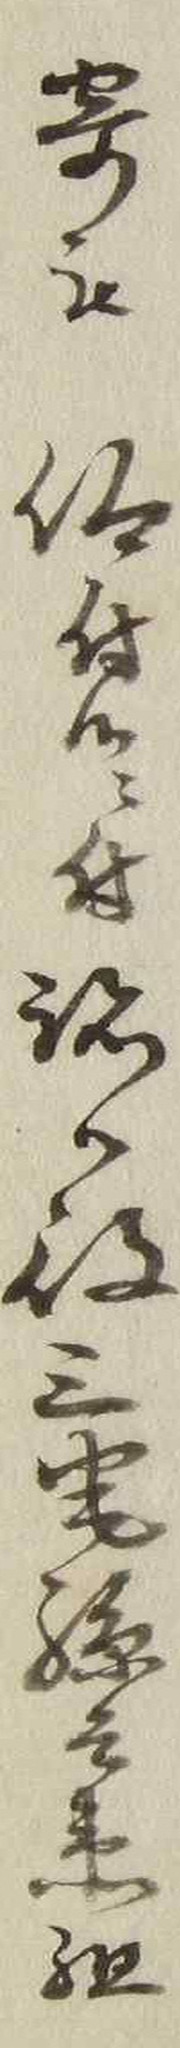寄被仰付候ニ付跡御役三宅孫兵衛組
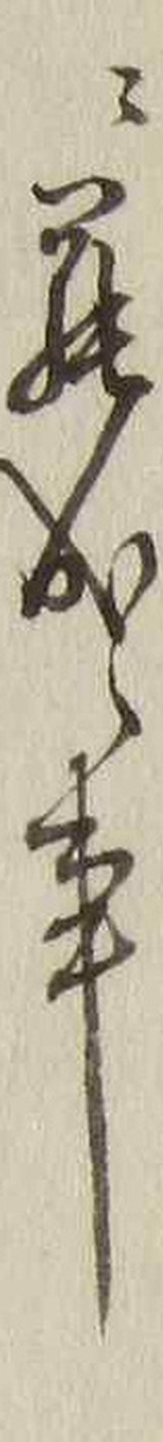ニ罷成候事
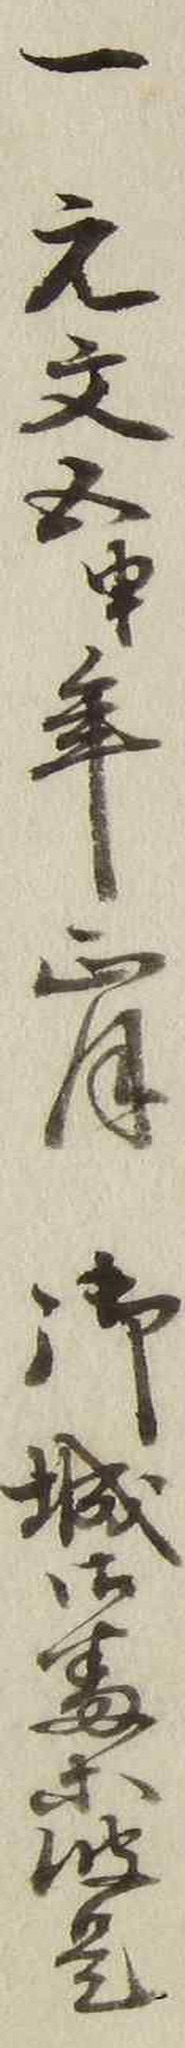一元文五申年正月御城御番等彼是
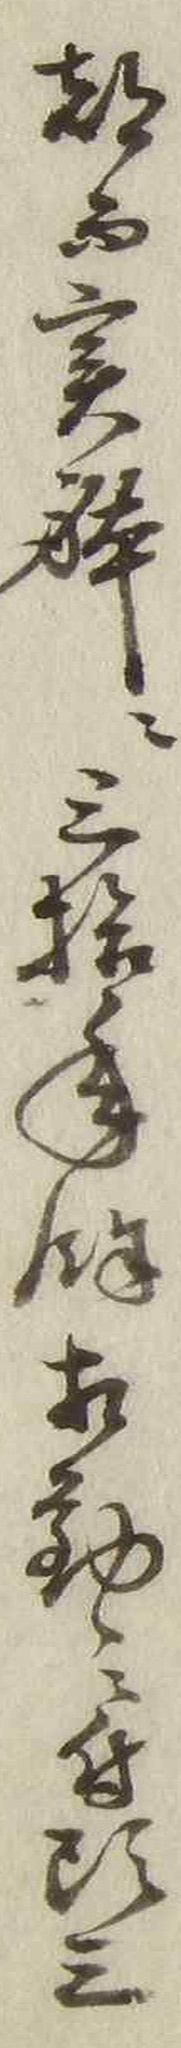都而実体ニ三拾年余相勤候ニ付頭三
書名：諸士系譜　巻之27　い之部27
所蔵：会津若松市立会津図書館
